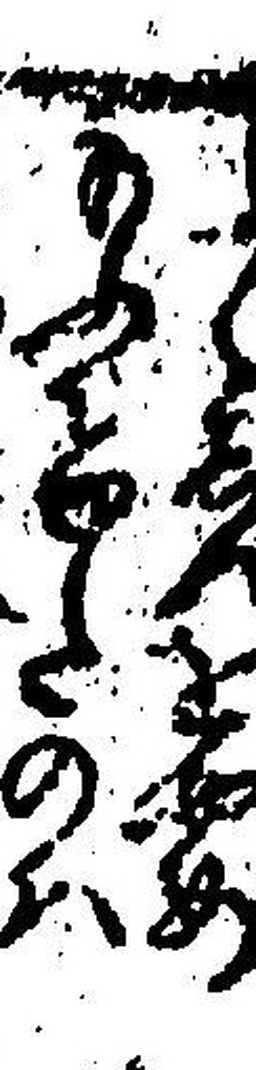もふけたのは
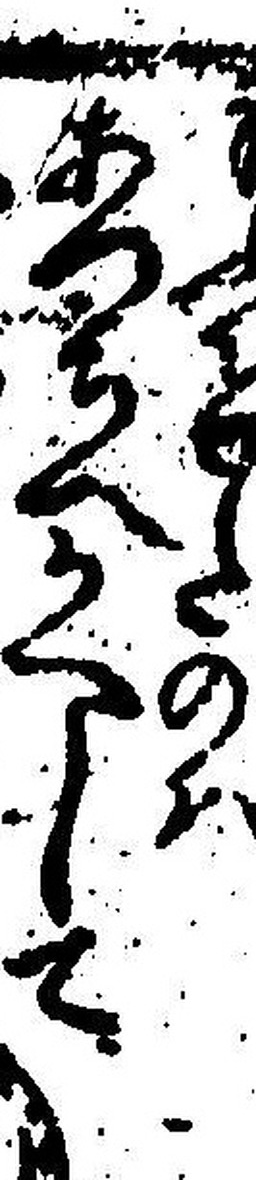あつちへかへして
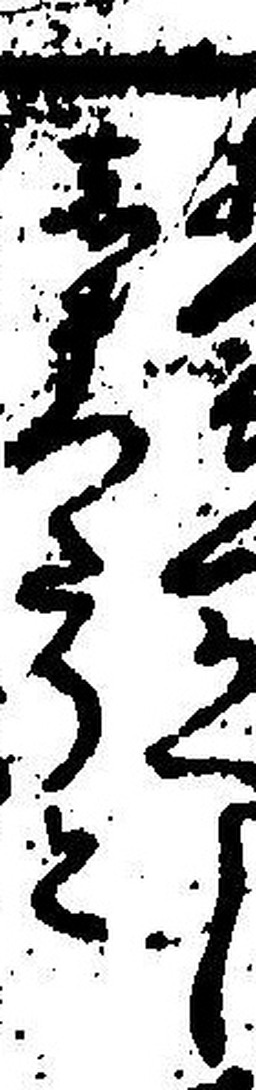しまつたりと
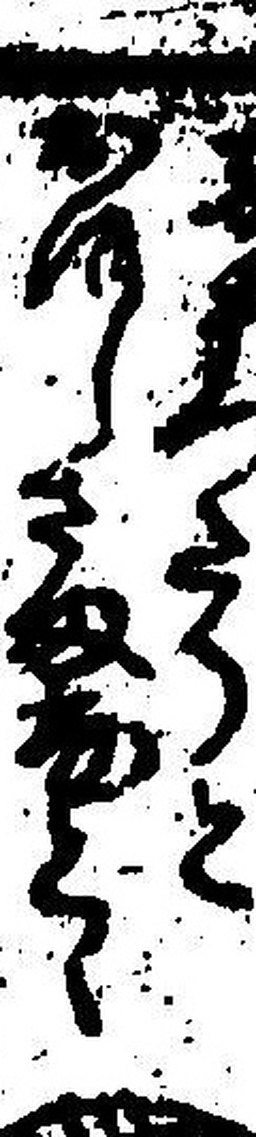おほしさまなとゝ
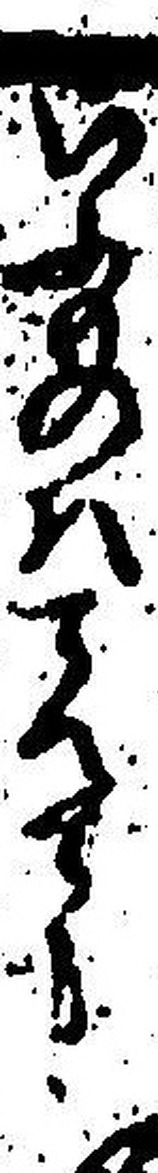いふものはてんても
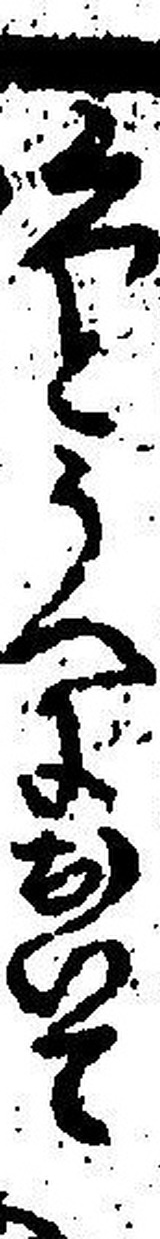くつとうへにおいて
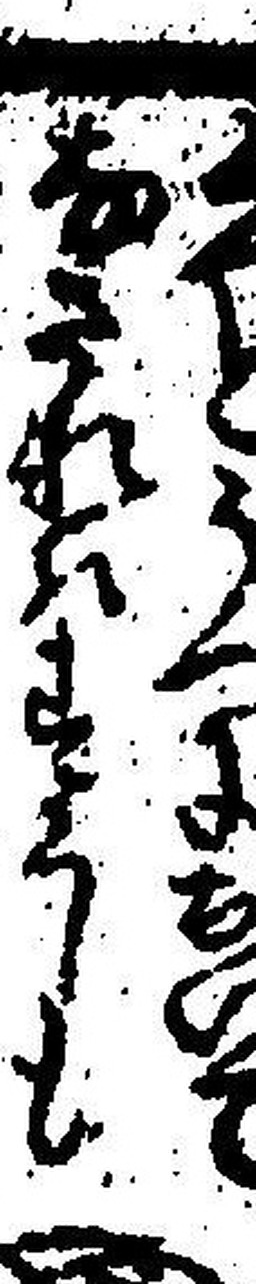なされはすこしも
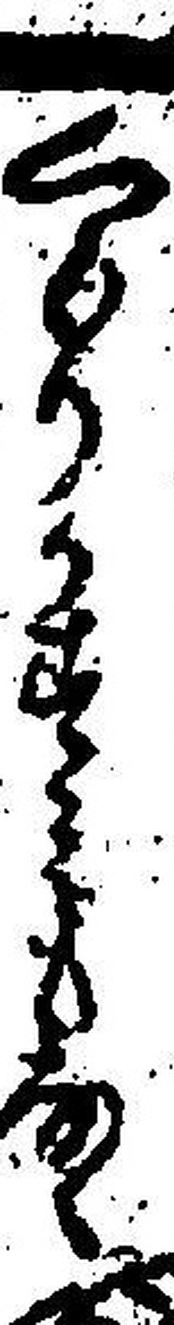くもりかすみもなく
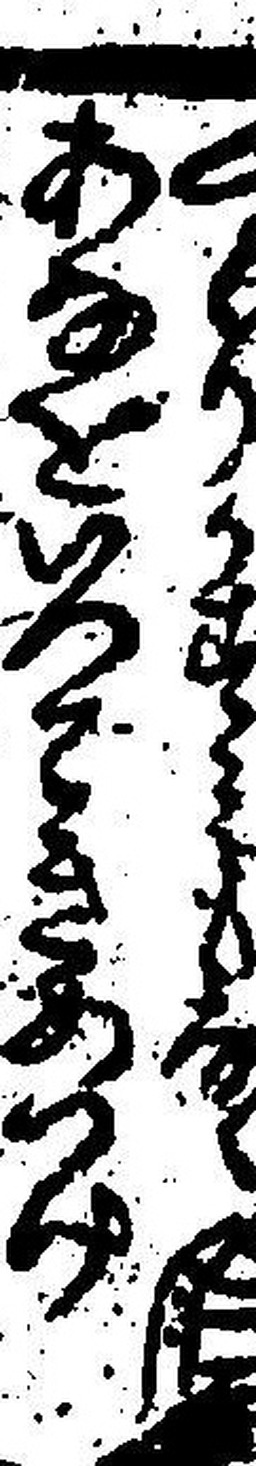あなをいつてきあつけ
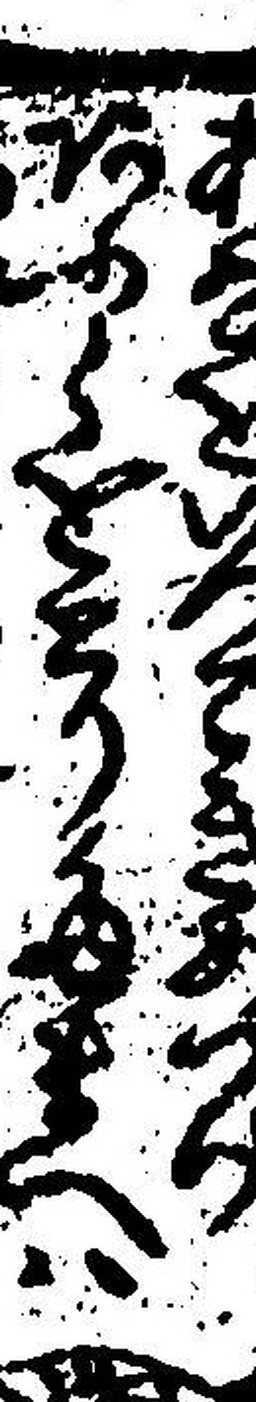あふらをとりたまへは
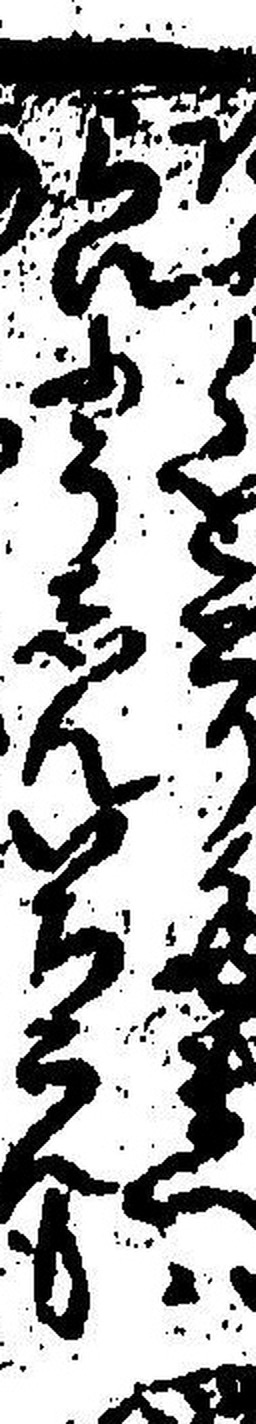らいふうしんいちこんも
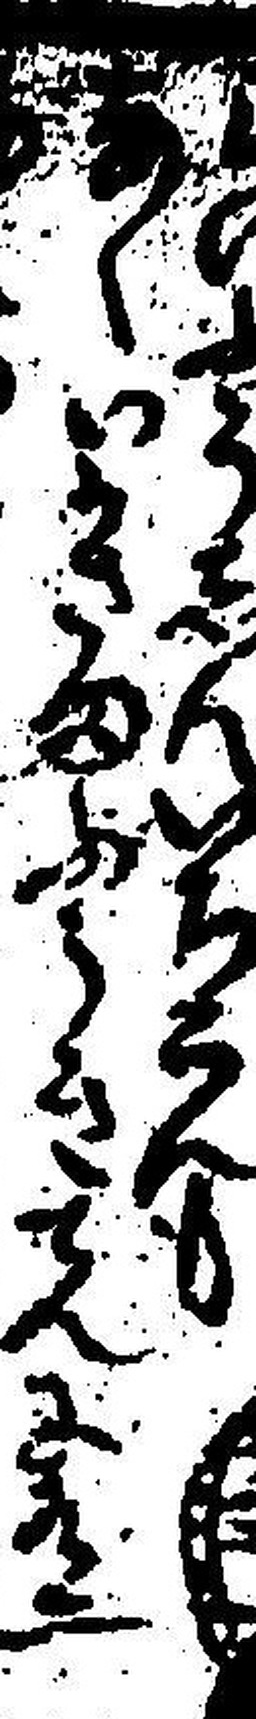なくいかさまふうきてんに有
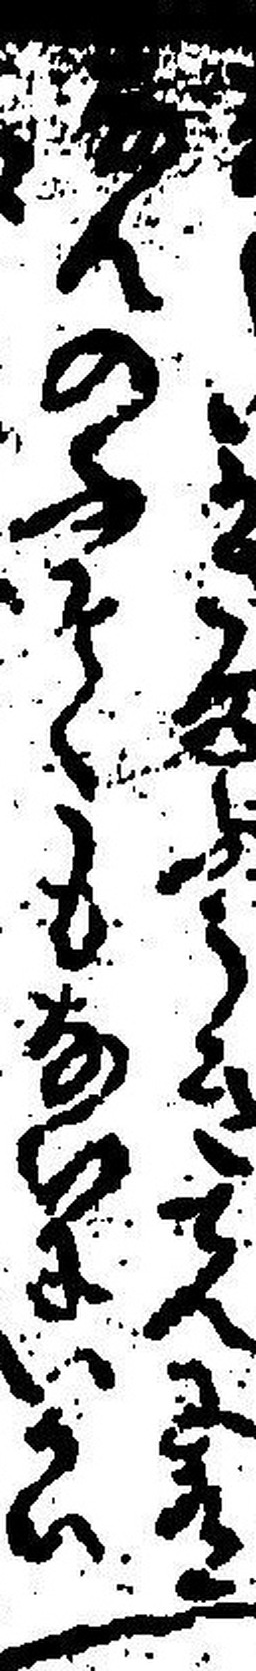なんのふそくもないにいかい
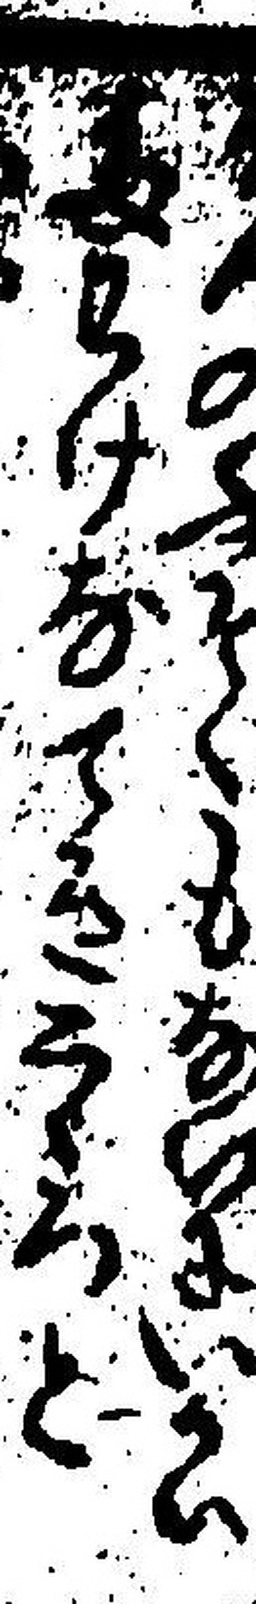たわけなてきこゝろと
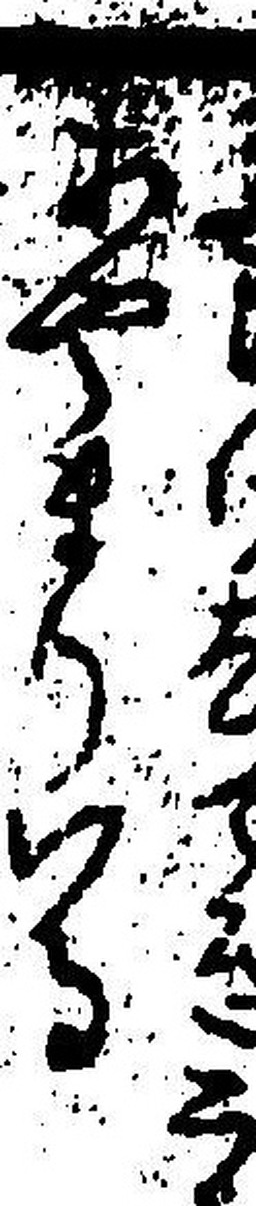あやまりいる

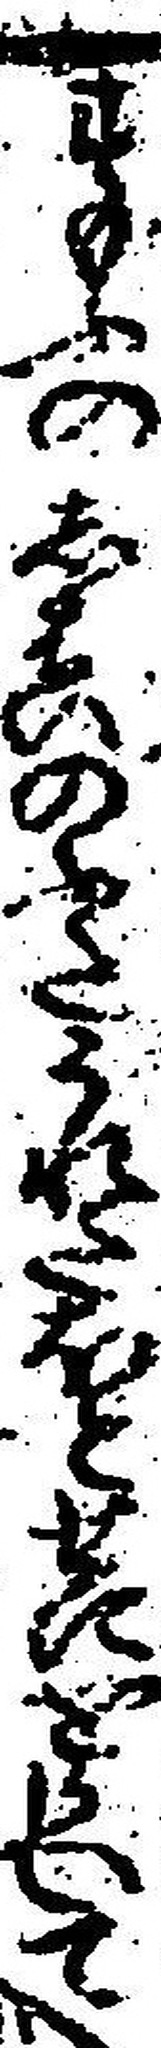すもふのしはいのふたうれたほとせにをかへし
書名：天竺儲之筋 / 市場通笑作
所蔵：東京大学総合図書館 General Library in the University of Tokyo, JAPAN
